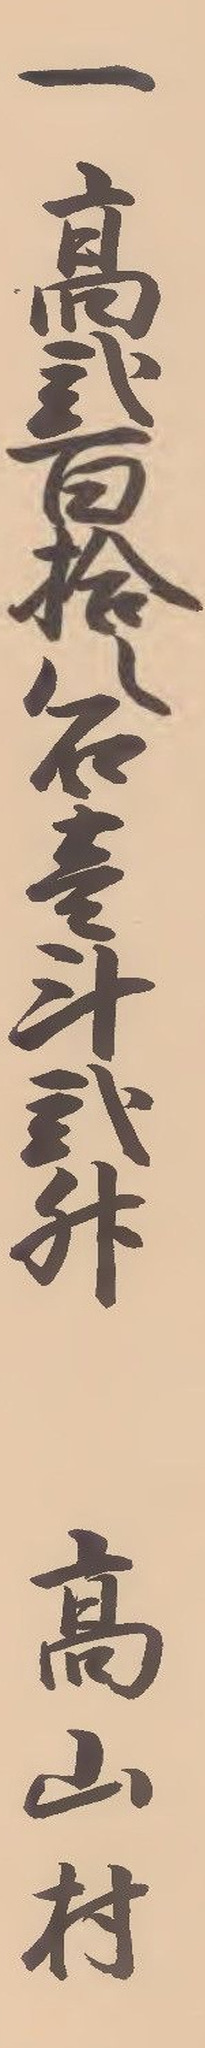一高弐百拾八石壱斗弐升高山村
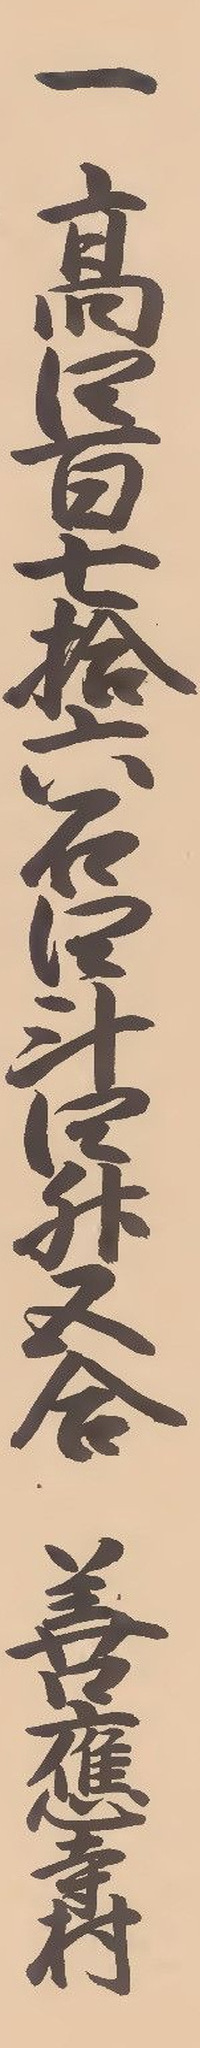一高四百七拾六石四斗四升五合善応寺村
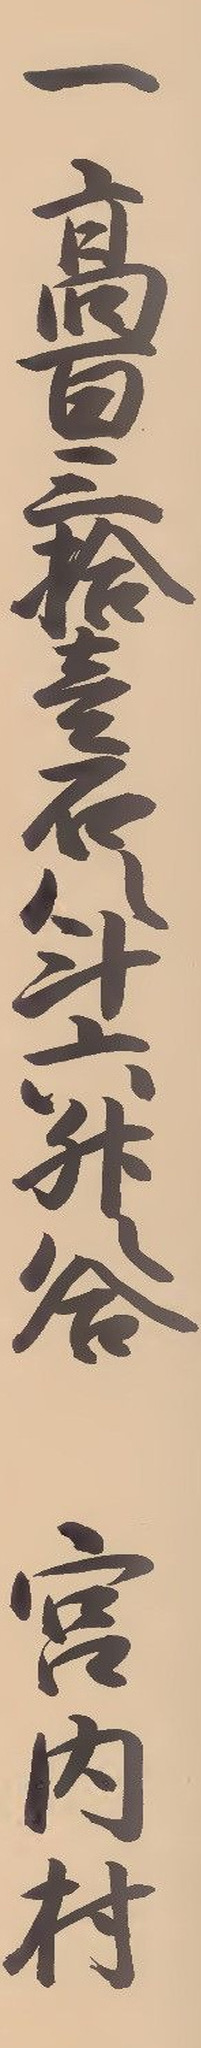一高百三拾壱石八斗六升八合宮内村
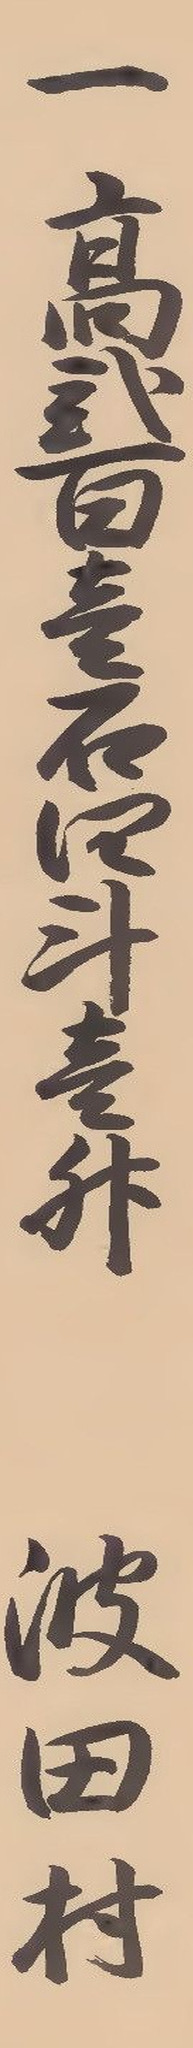一高弐百壱石四斗壱升波田村
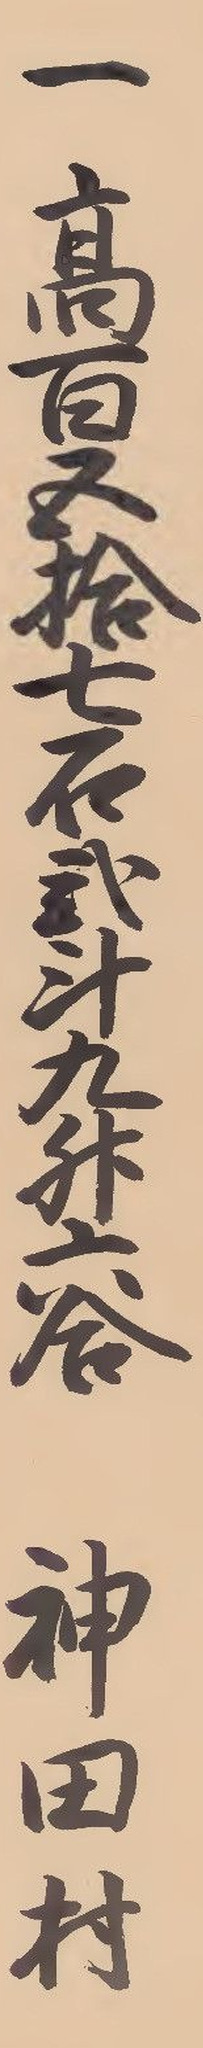一高百五拾七石弐斗九升六合神田村

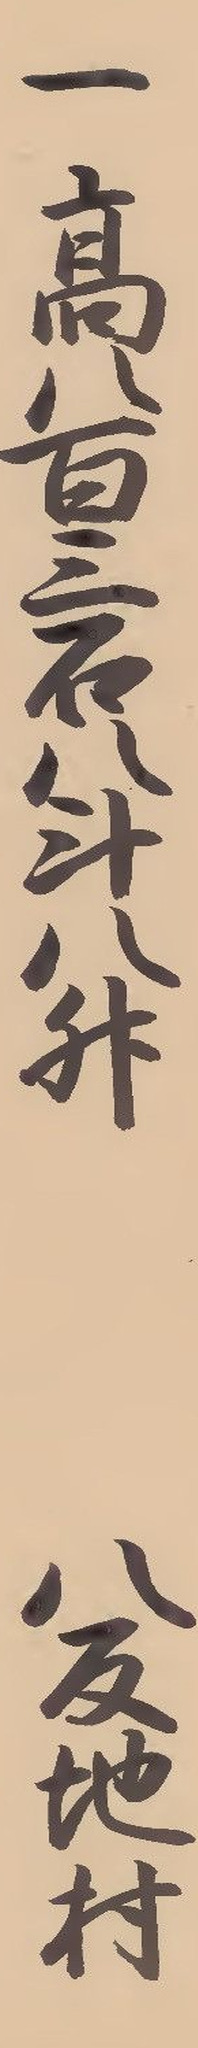一高八百三石八斗八升八反地村
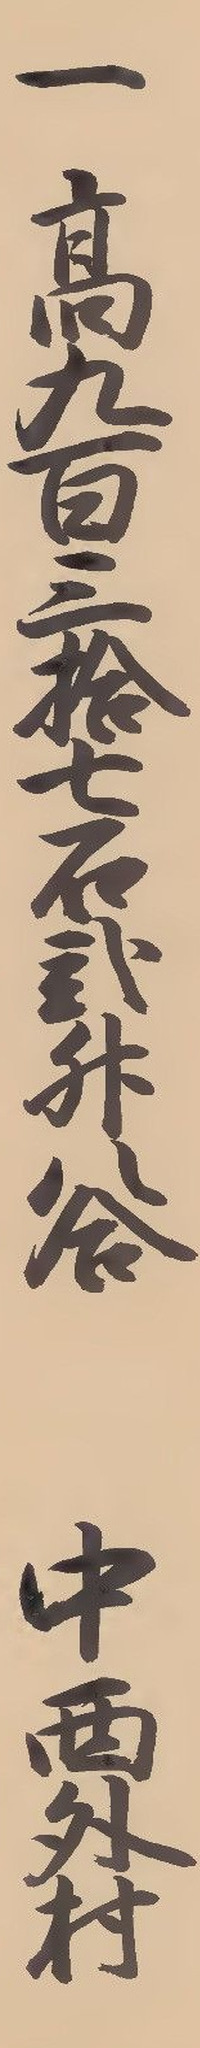一高九百三拾七石弐升八合中西外村
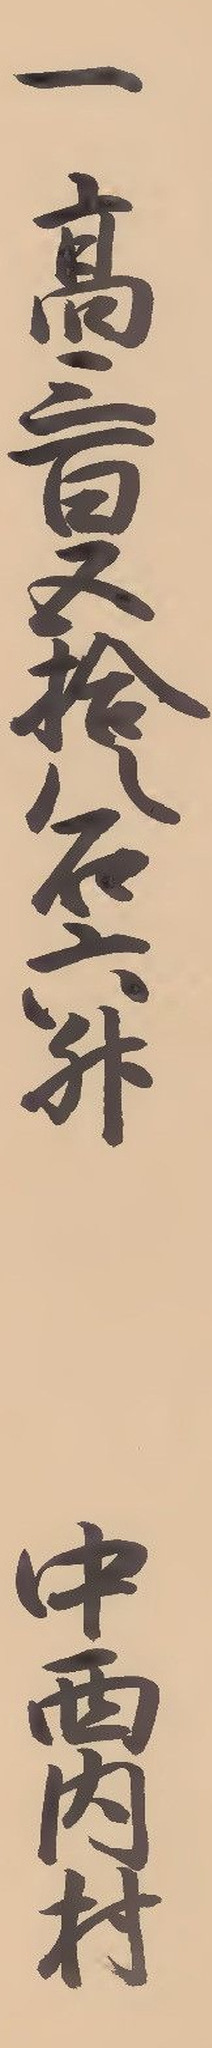一高三百五拾八石六升中西内村
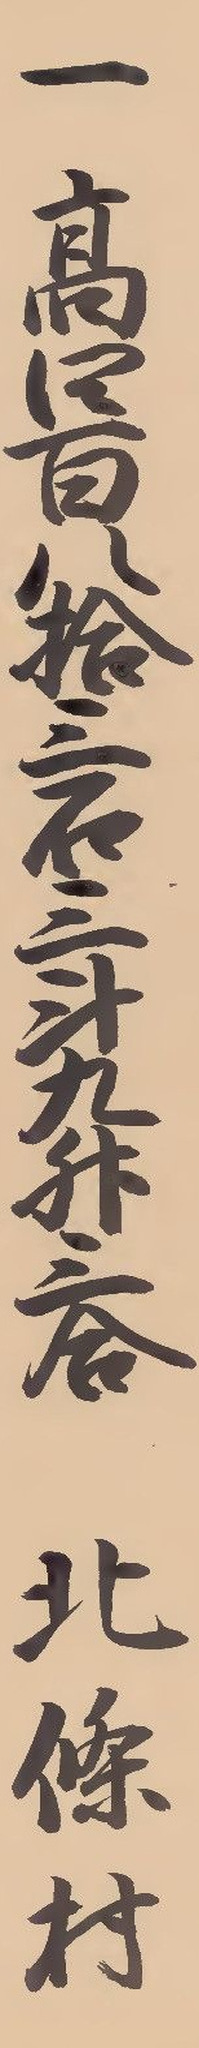一高四百八拾三石三斗九升三合北条村
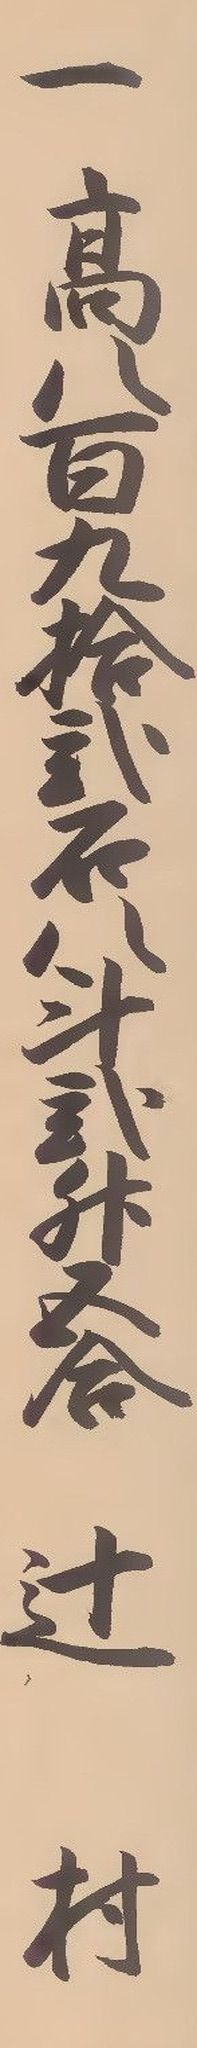一高八百九拾弐石八斗弐升五合辻村
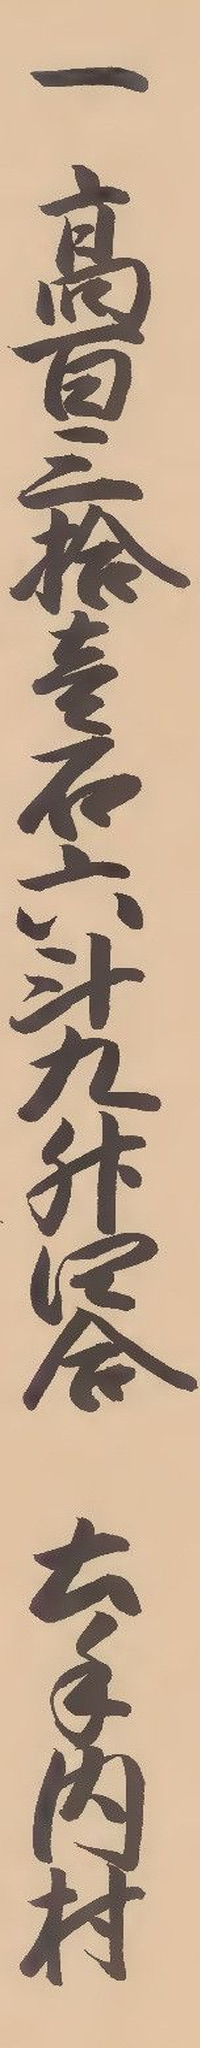一高百三拾壱石六斗九升四合土手内村
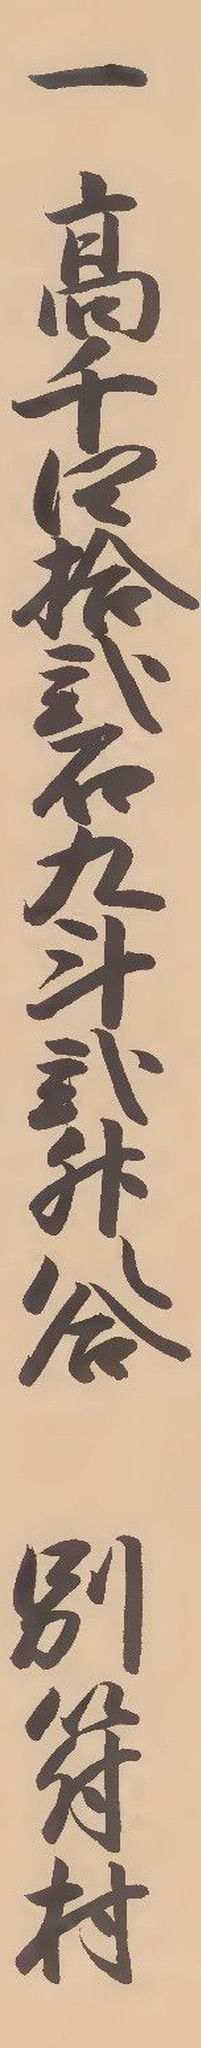一高千四拾弐石九斗弐升八合別符村

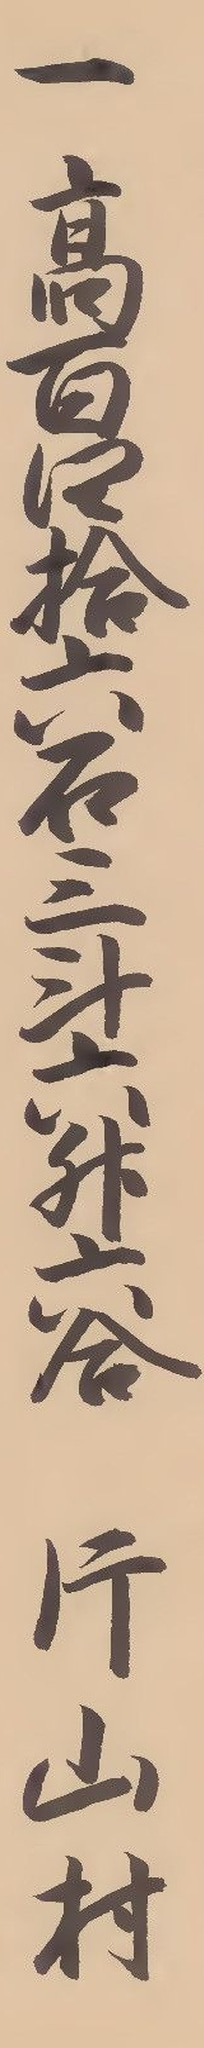一高百四拾六石三斗六升六合片山村
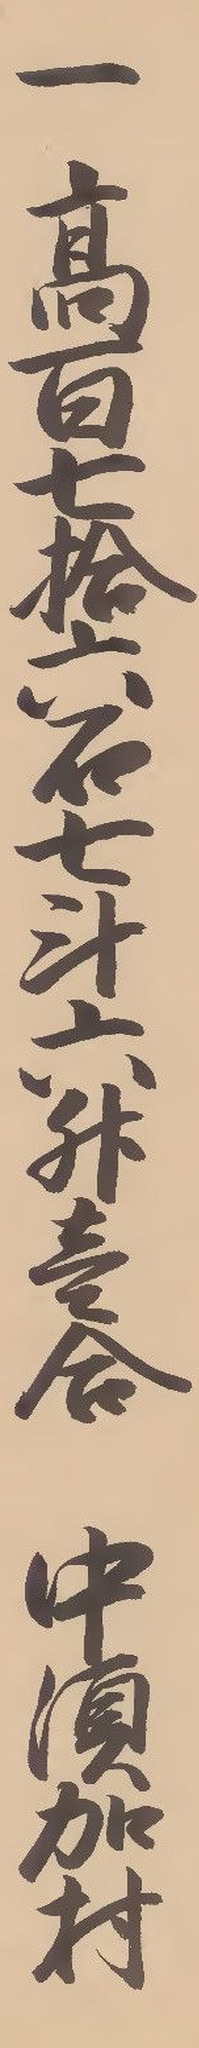一高百七拾六石七斗六升壱合中須加村
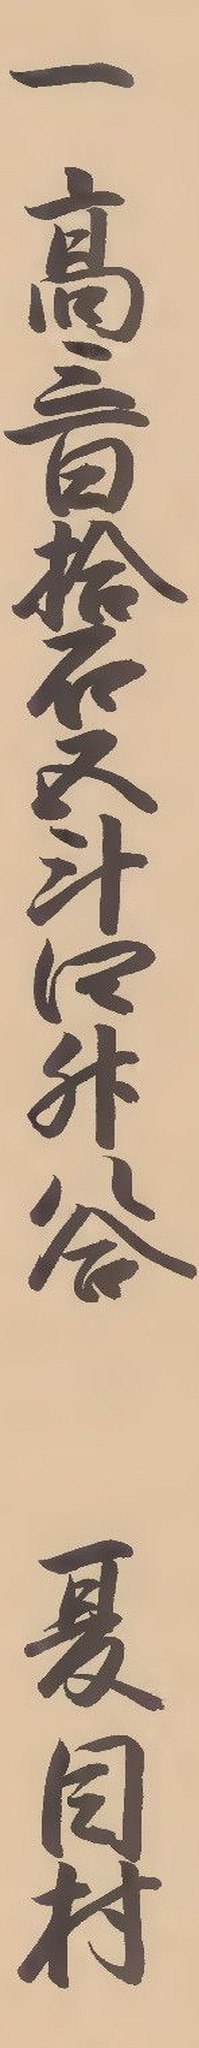一高三百拾石五斗四升八合夏目村
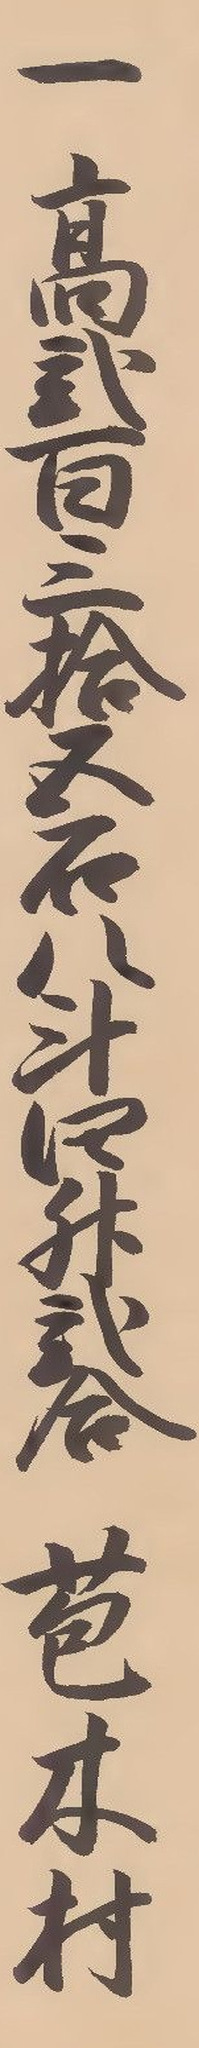一高弐百三拾五石八斗四升弐合苞木村
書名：伊予国郷帳
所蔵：国立公文書館 National Archives of Japan
